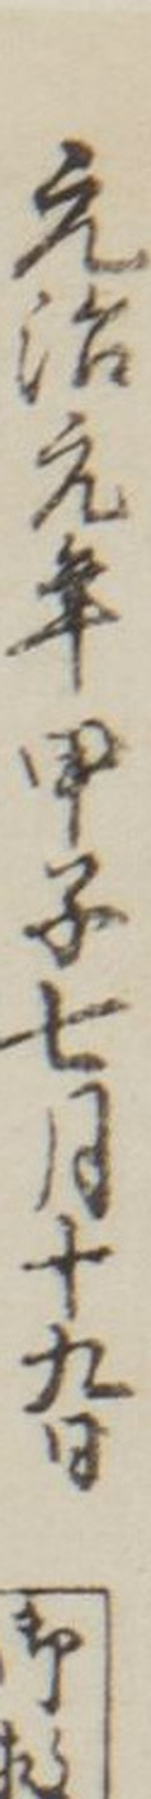元治元年甲子七月十九日
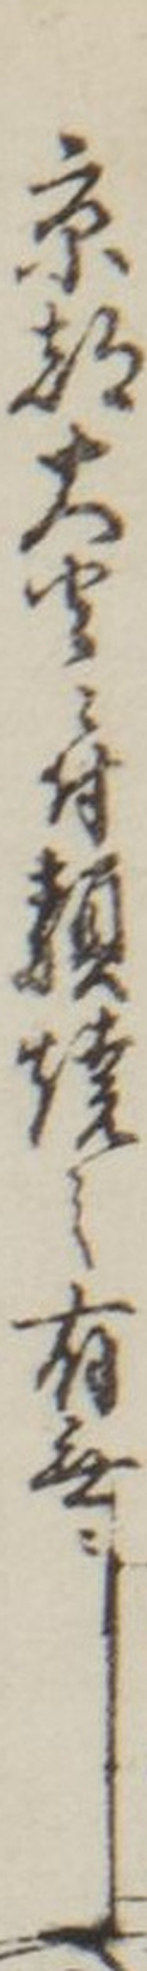京都大火に付類焼之有無に
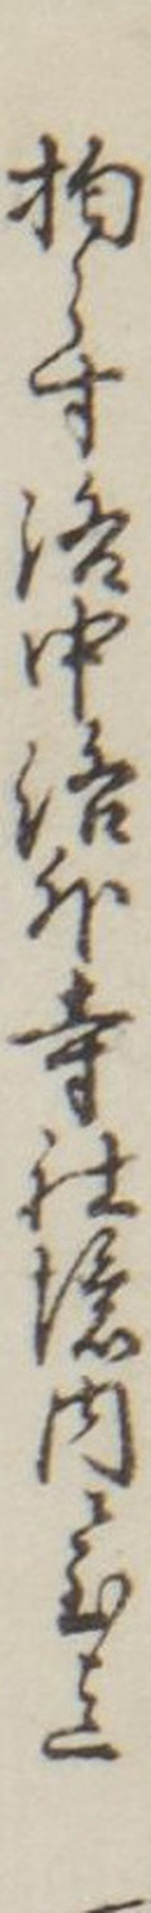拘らす洛中洛外寺社境内に至迄
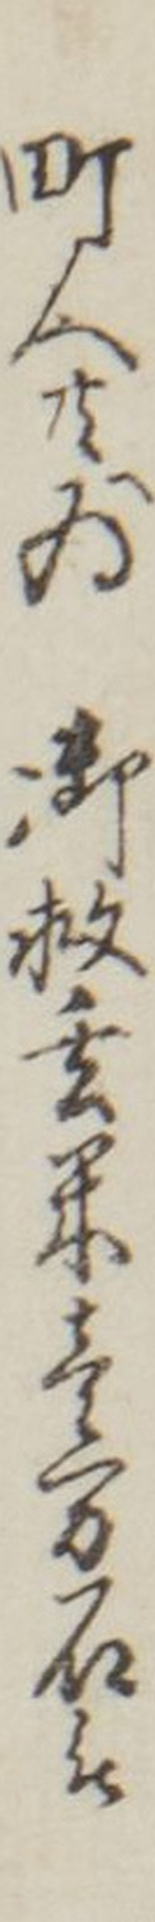町人共へ為御救玄米壱万石被
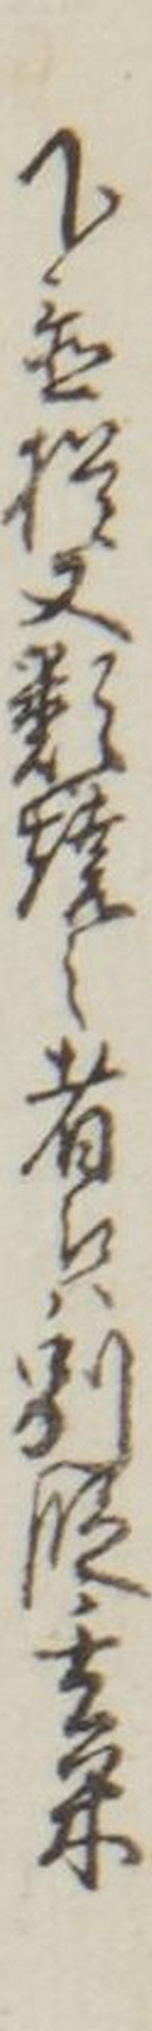下置猶又類焼之者えは別段玄米
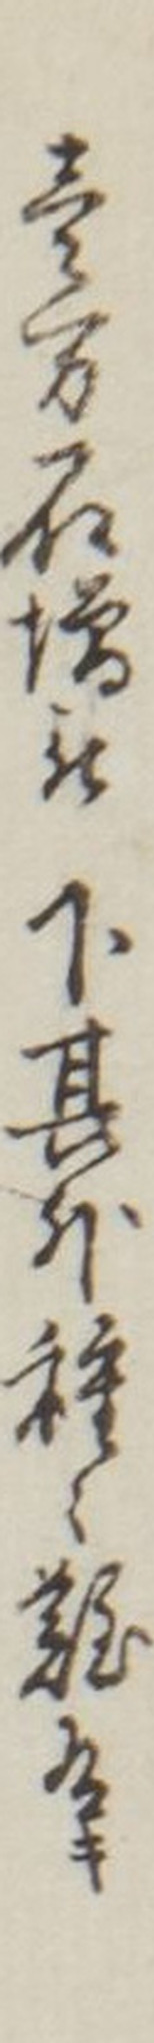壱万石増被下其外種々難有き
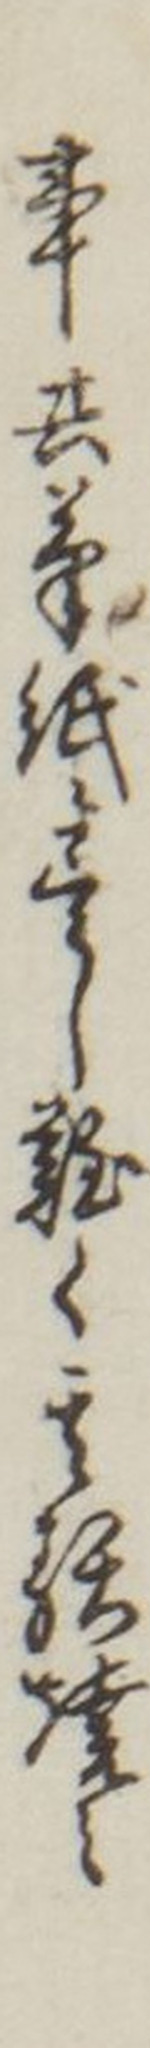事共筆紙に尽し難く其類焼之
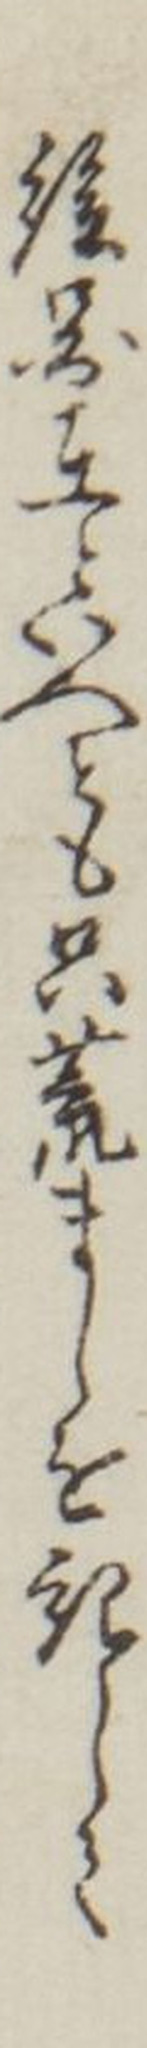絵図在といへとも只荒ましを記して
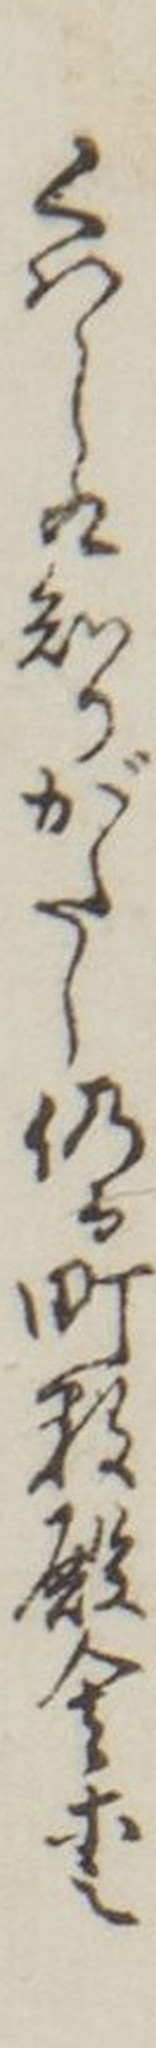くはしく知りがたし仍而町数殿舎等之
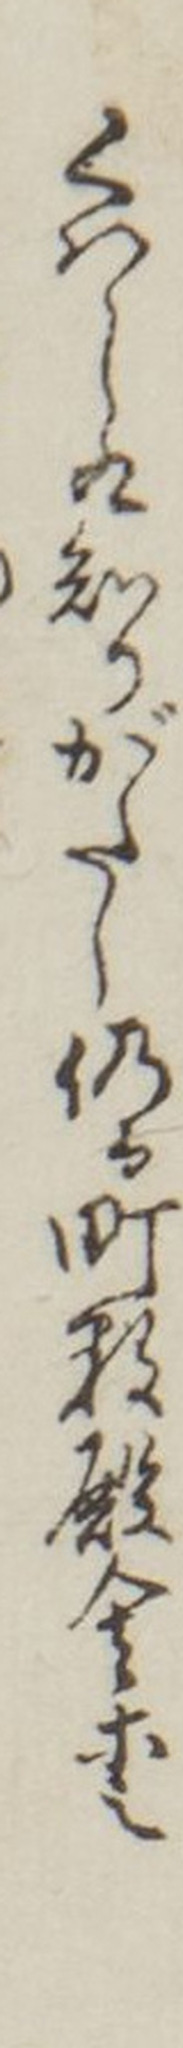くはしく知りがたし仍而町数殿舎等之
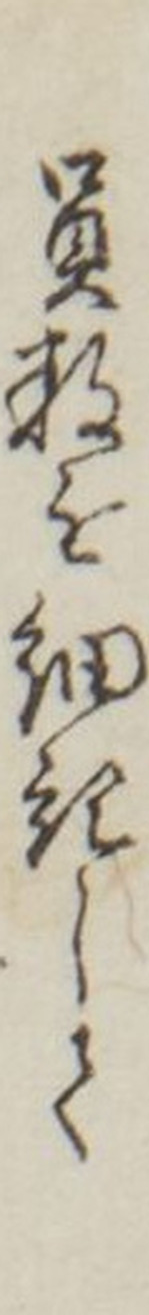員数を細記して
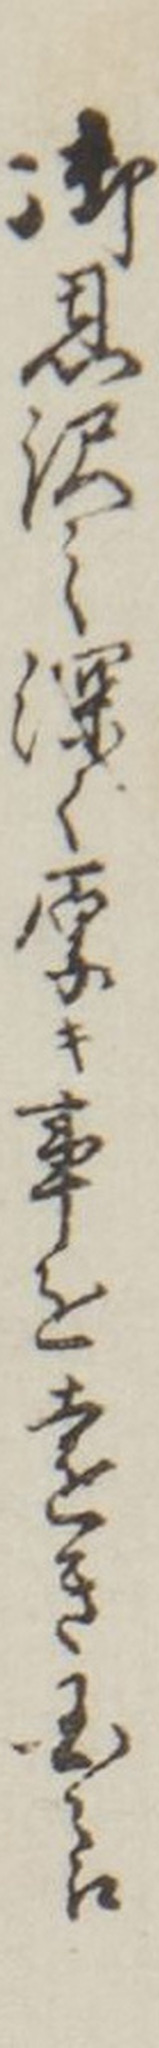御恩沢之深く厚き事を遠き国々え
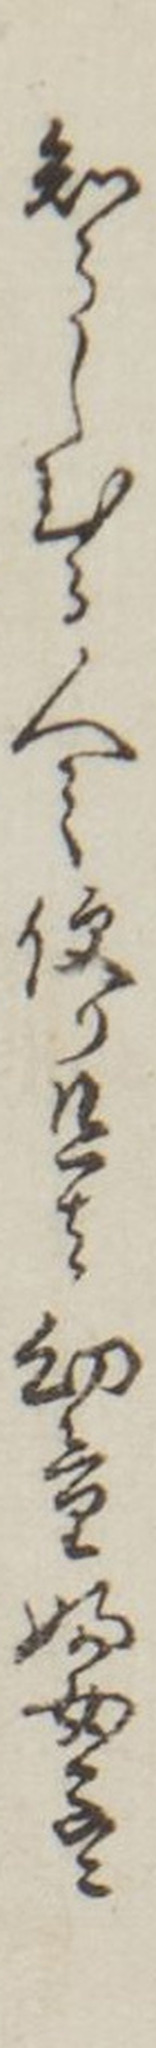知らしむる人之便り且は幼童婦女子に
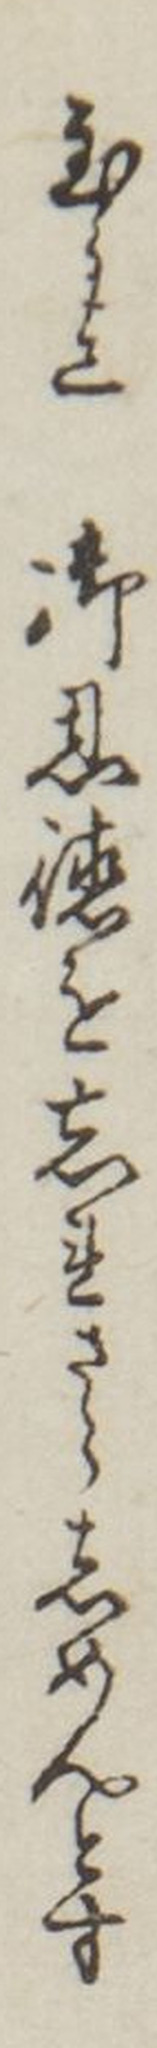至る迄御恩徳を忘れさらしめんとす
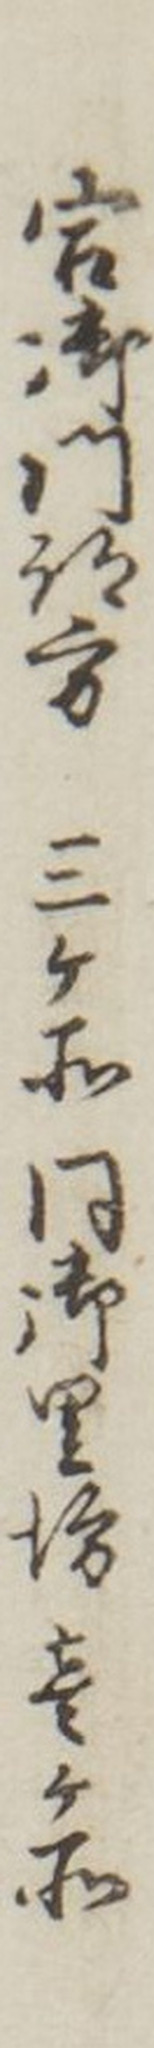宮御門跡方三ヶ所同御里坊壱ヶ所
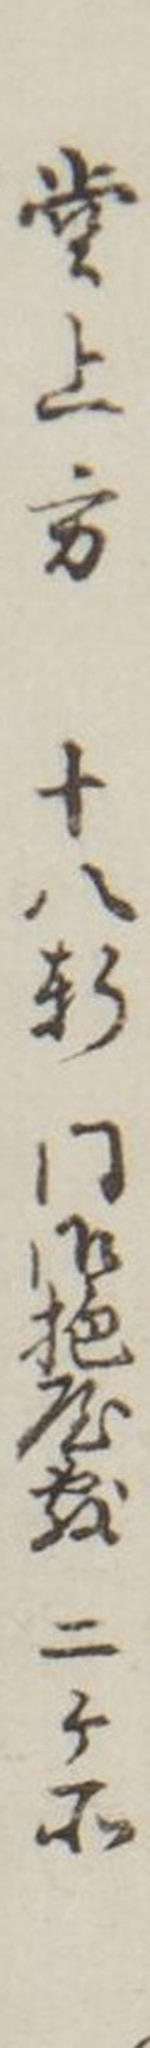堂上方十八軒同御抱屋敷二ヶ所
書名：京都大火記事
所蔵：あいおいニッセイ同和損保株式会社
